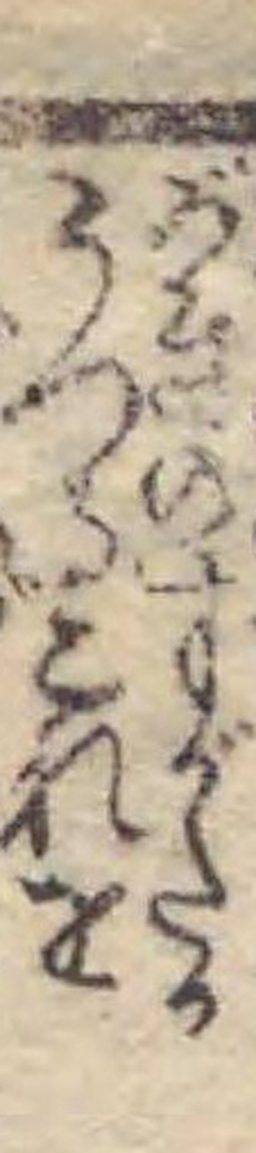うつるこれを
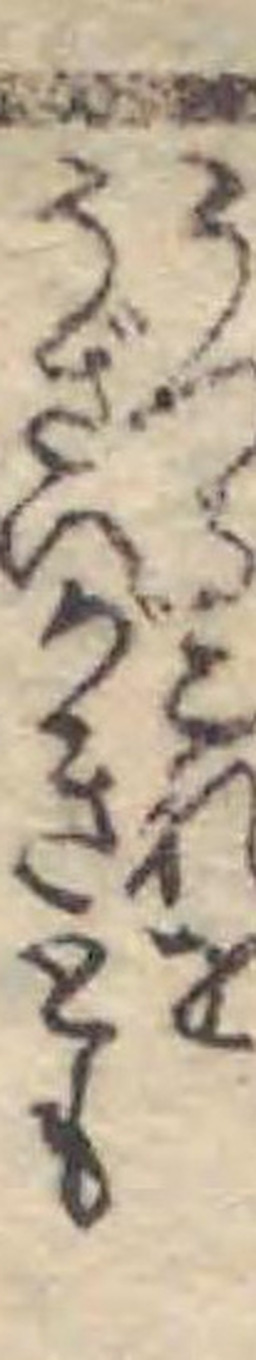うざいがきとも
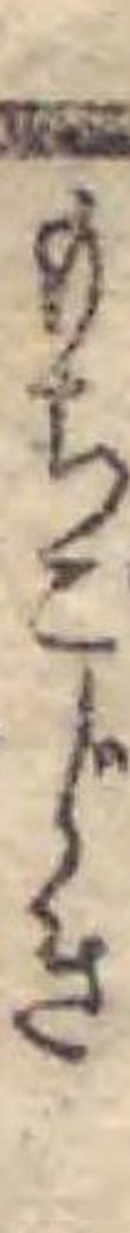もちこじき
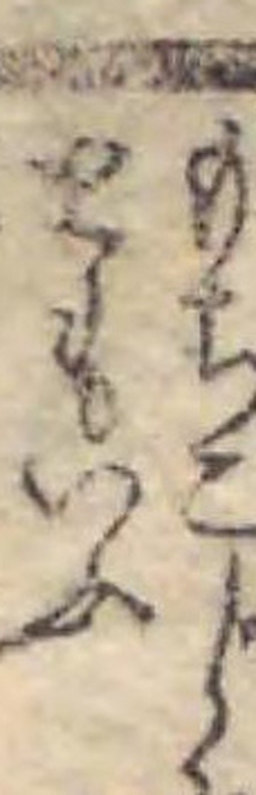ともいふ
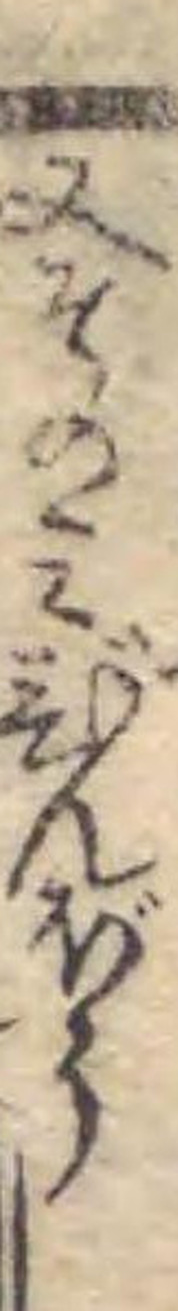又そのみびんぼう
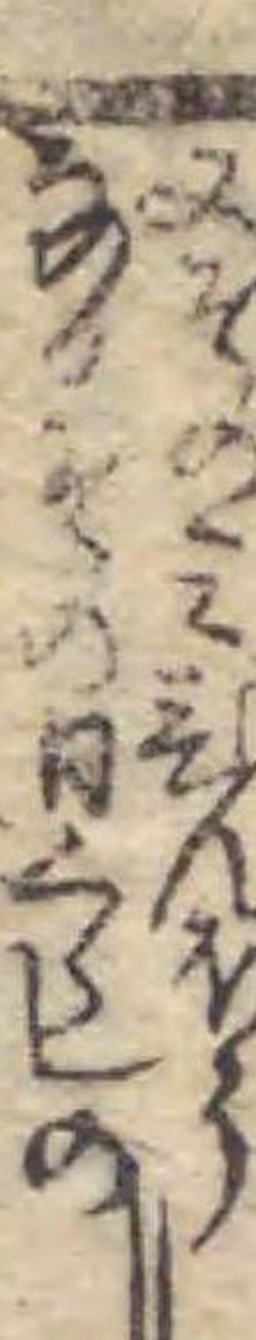なるその日くらしの
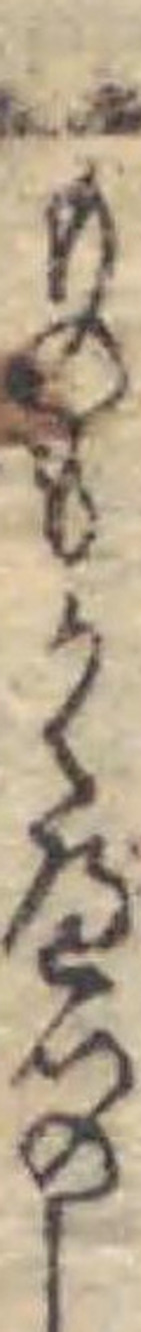ものもかくべつの
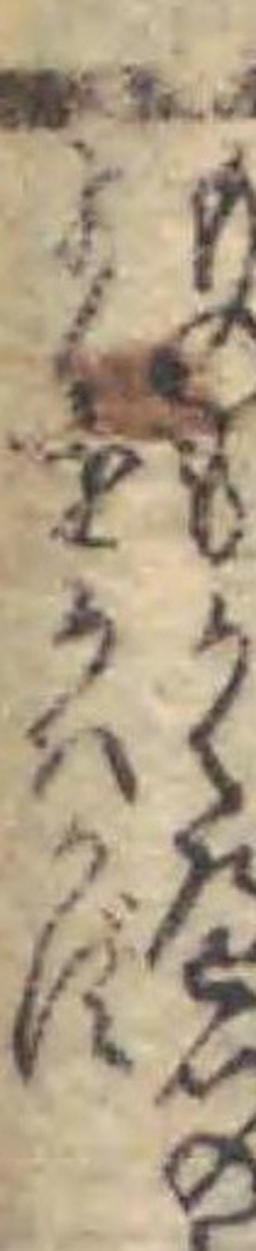よくをかはかず
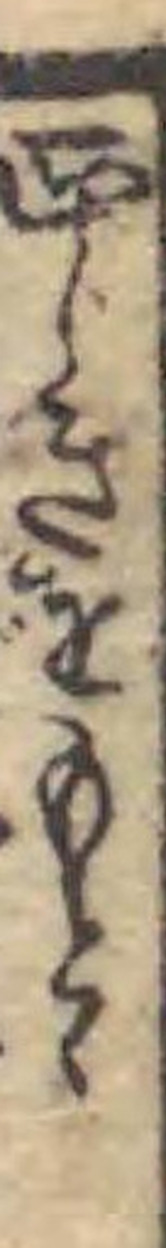正じきをもとゝ
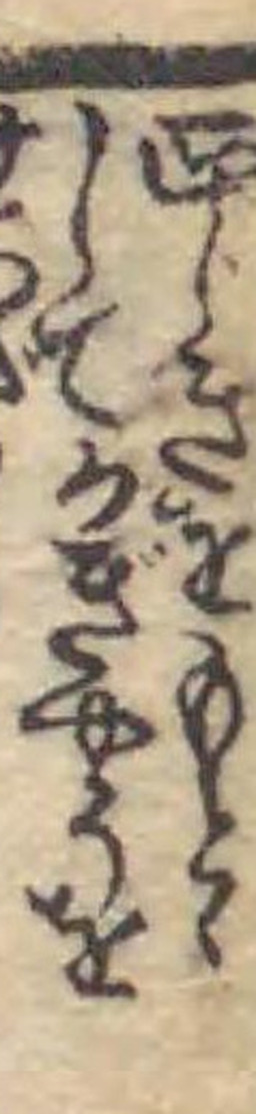してかぎやうを
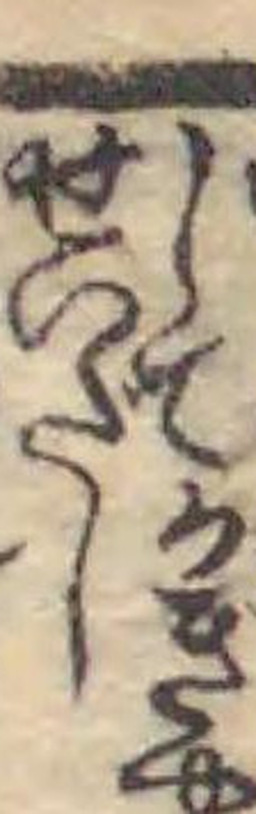せいだし
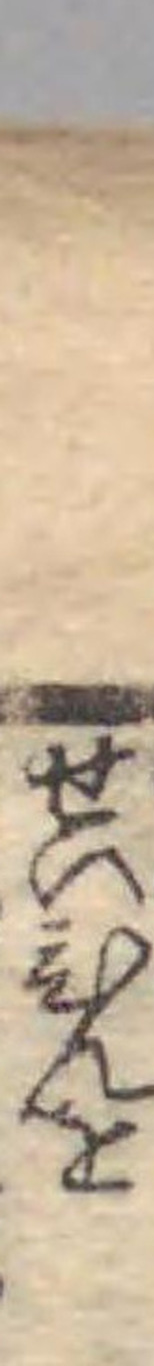せいひんを
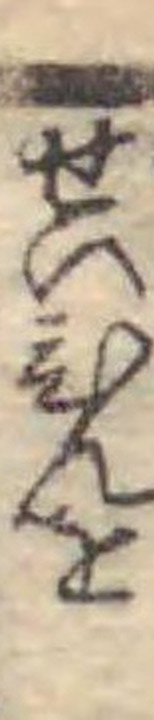せいひんを
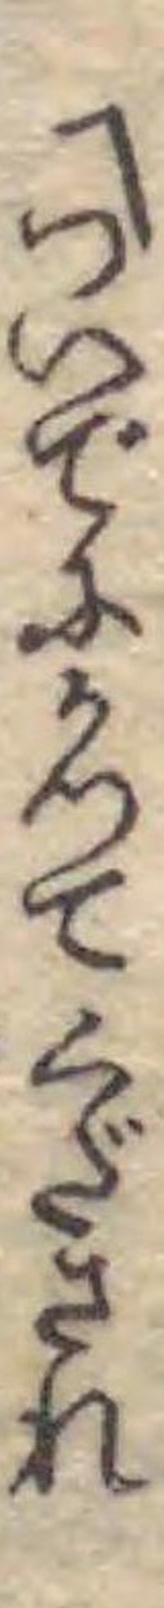〽ついでかつてくだされ
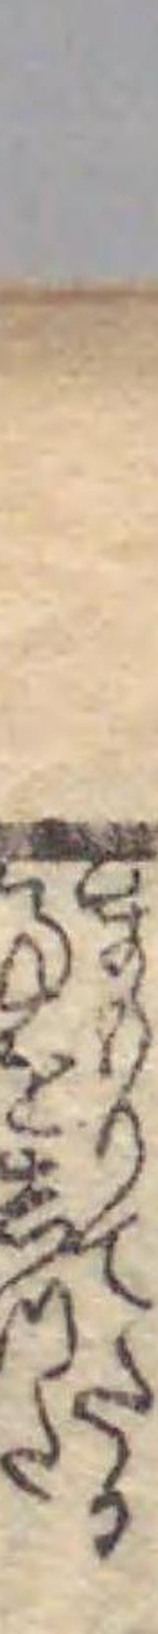事をしつた
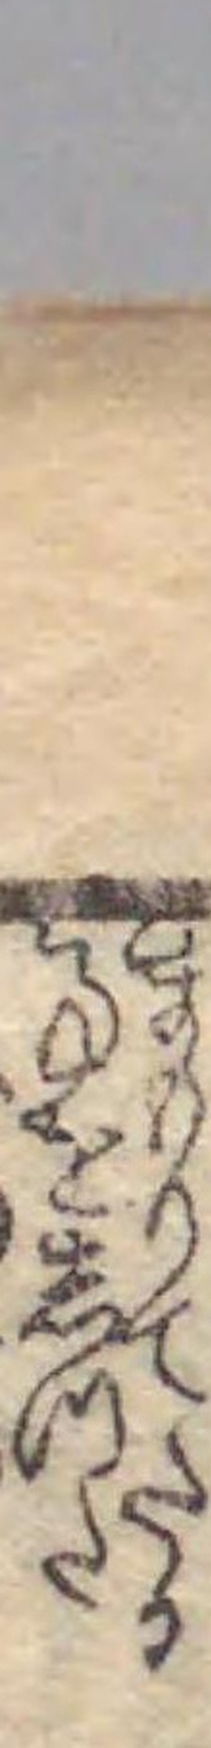事をしつた
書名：人心鏡写絵 : 3巻
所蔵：国立国会図書館 National Diet Library, JAPAN
